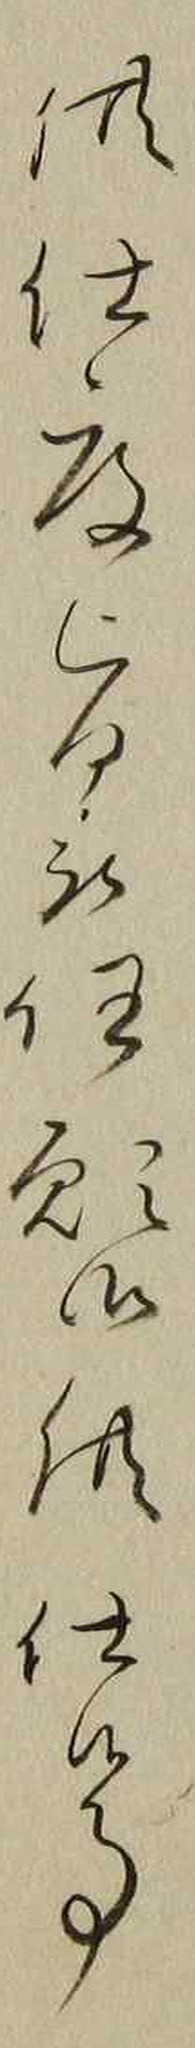供仕度旨被任願御供仕候事
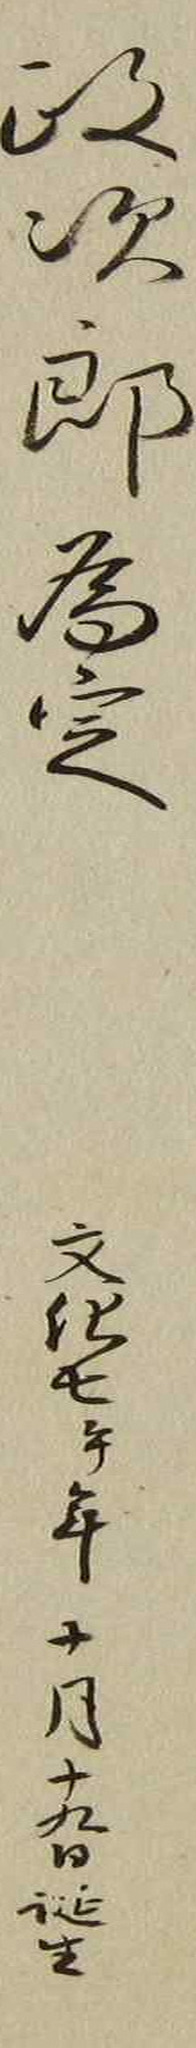政次郎為定文化七午年十月十九日誕生
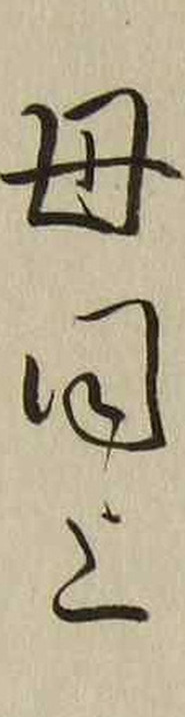母同上

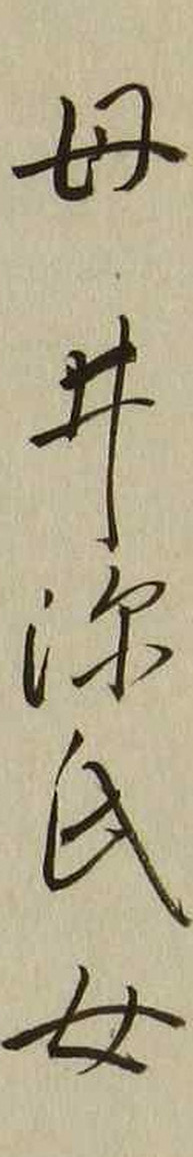母井深氏女
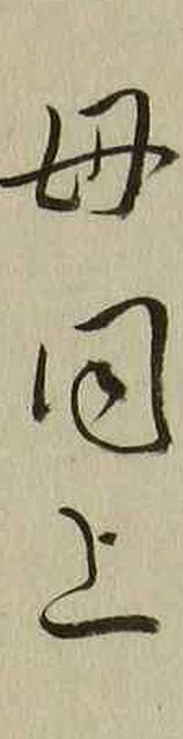母同上
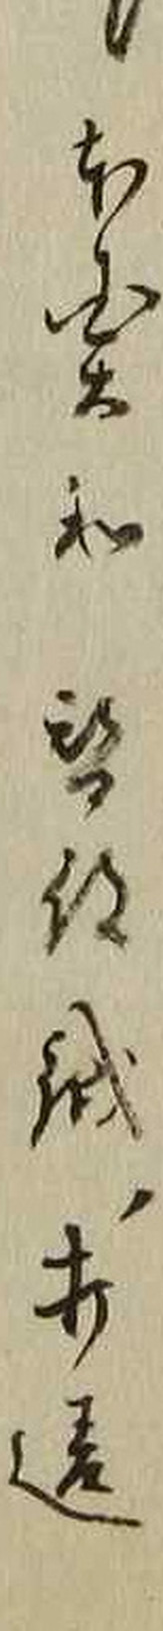本国大和替紋鉞ノ打違
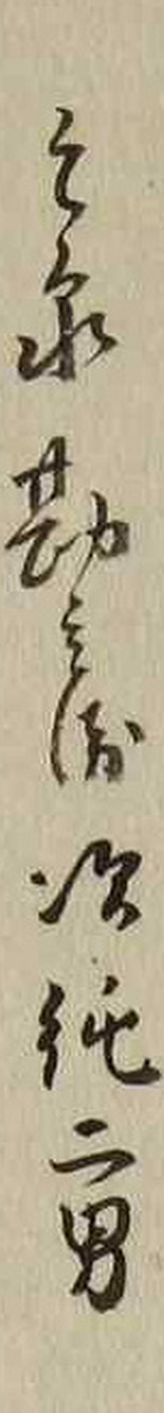今泉勘兵衛次純二男
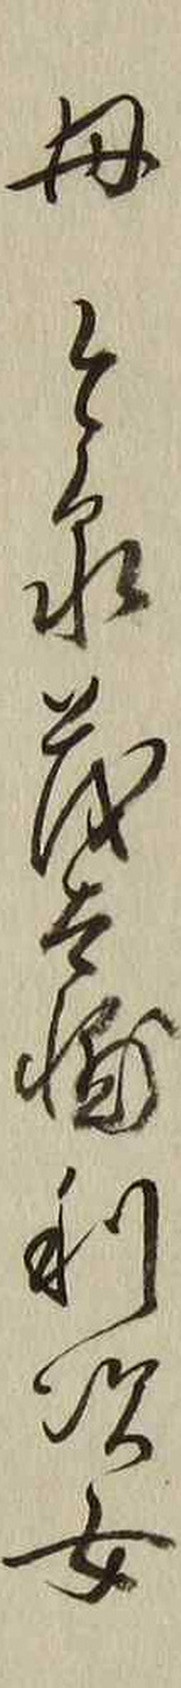母今泉茂太輔利次女
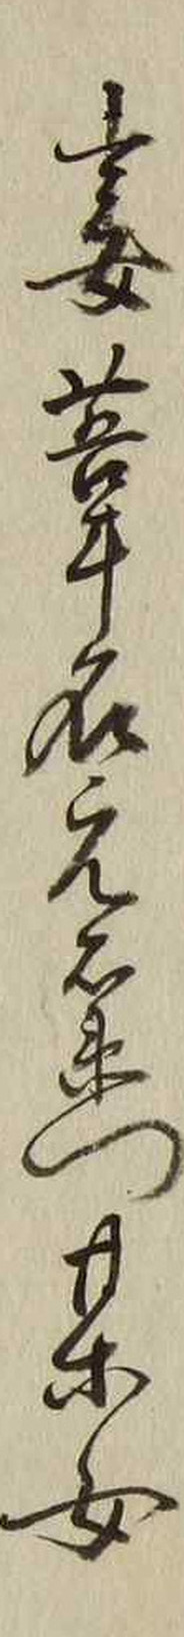妻葦名元右衛門某女
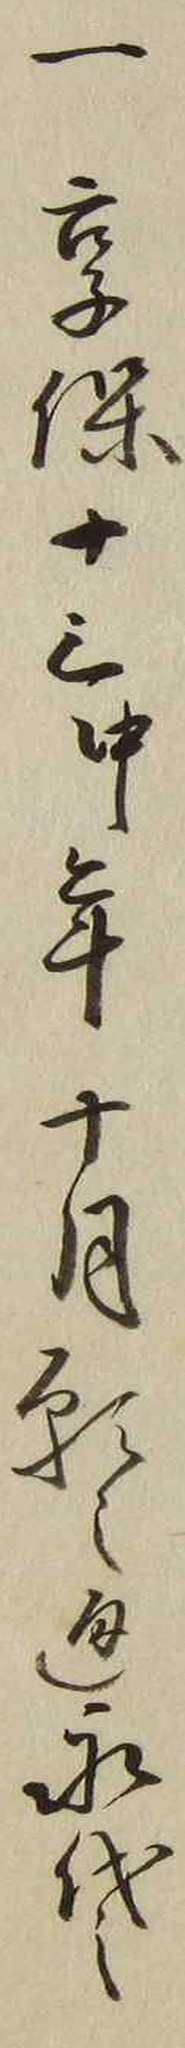一享保十三申年十月願之通永代之

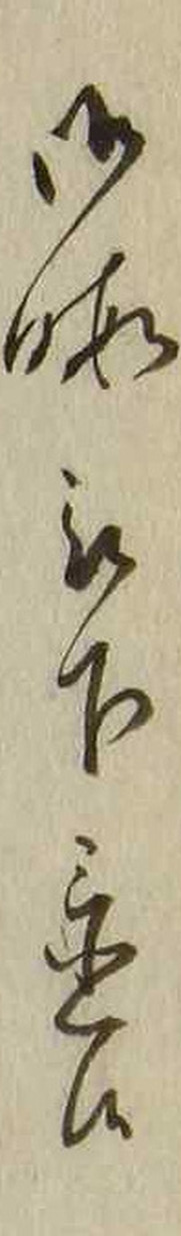御暇被下置候
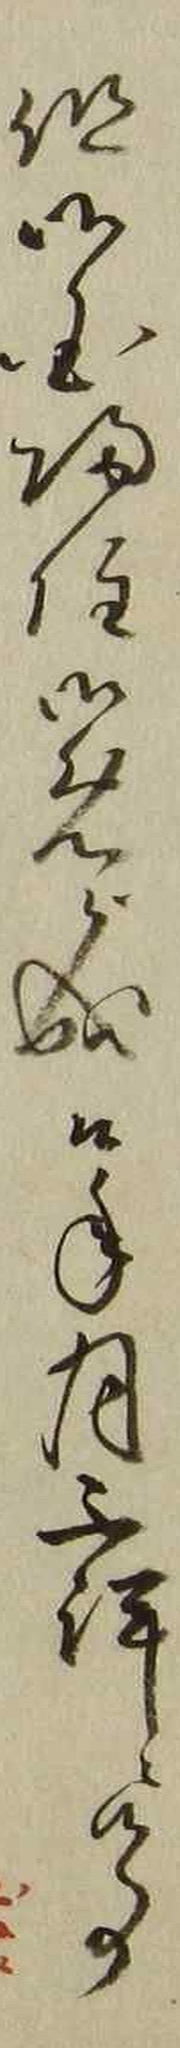但御国帰住御免被成候年月不詳に候事
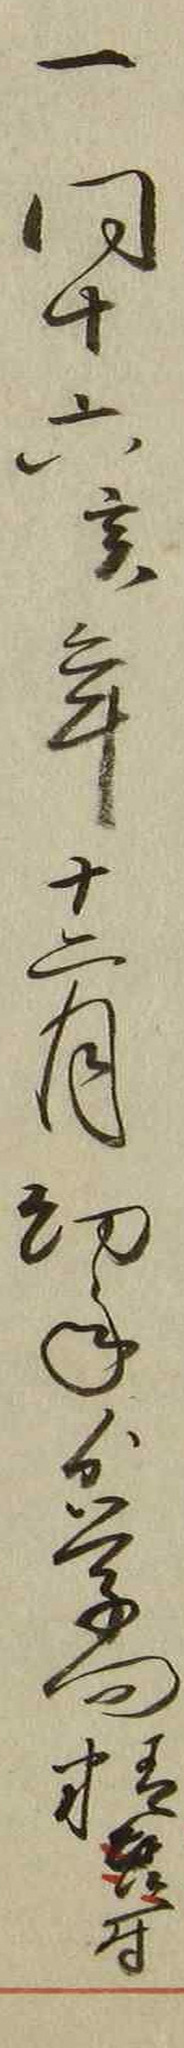一同十六亥年十二月幼年ゟ学問精付
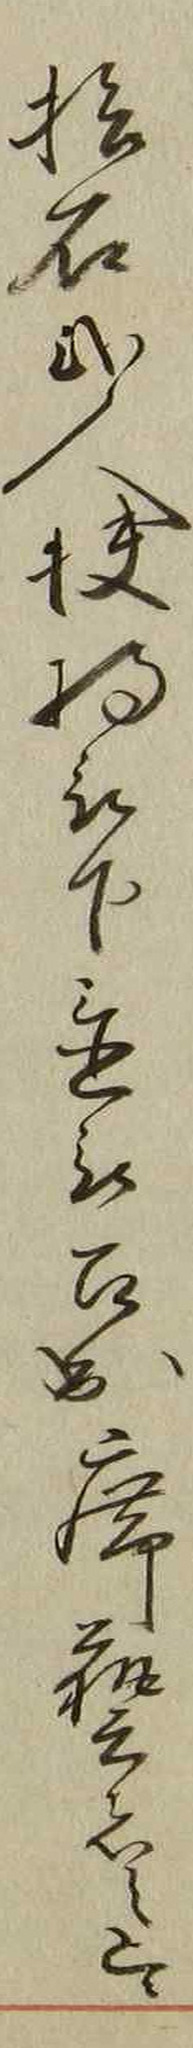拾石弐人扶持被下置被召出席芸者之上に
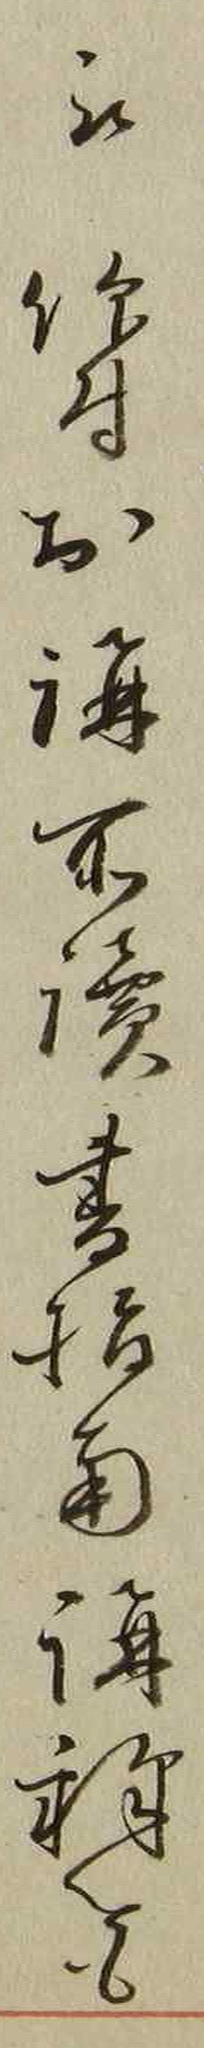被仰付於講所読書指南講釈をも
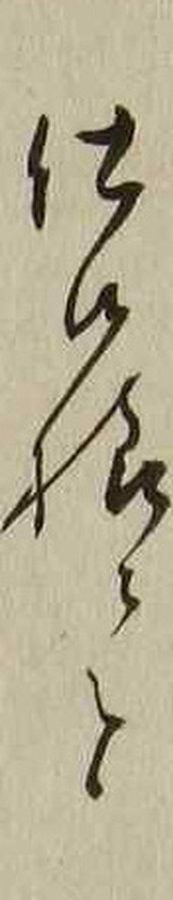仕候様にと
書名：諸士系譜　巻之3　い之部3
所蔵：会津若松市立会津図書館
